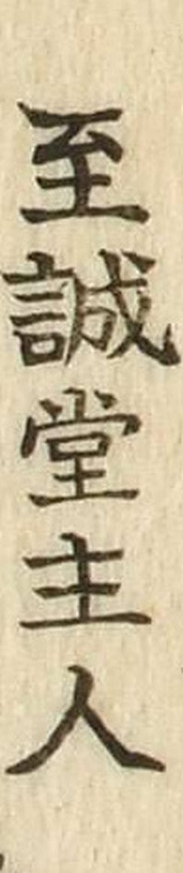至誠堂主人

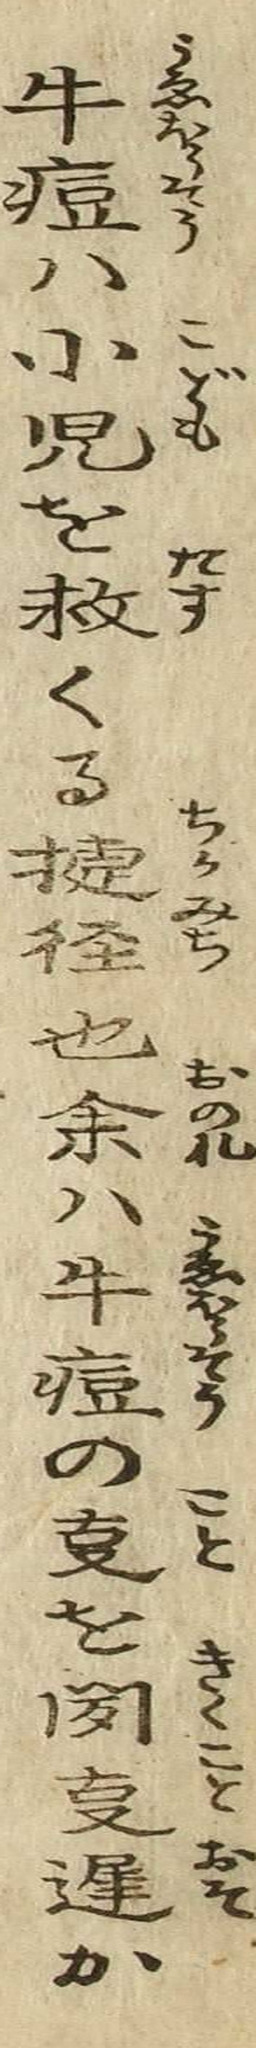牛痘は小児を救くる捷径也余ハ牛痘の㕝を聞㕝遅か
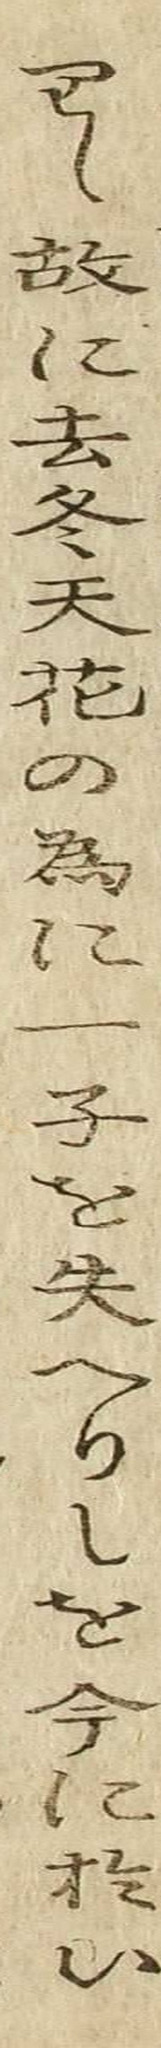りし故に去年天花の為に一子を失へりしを今に於い
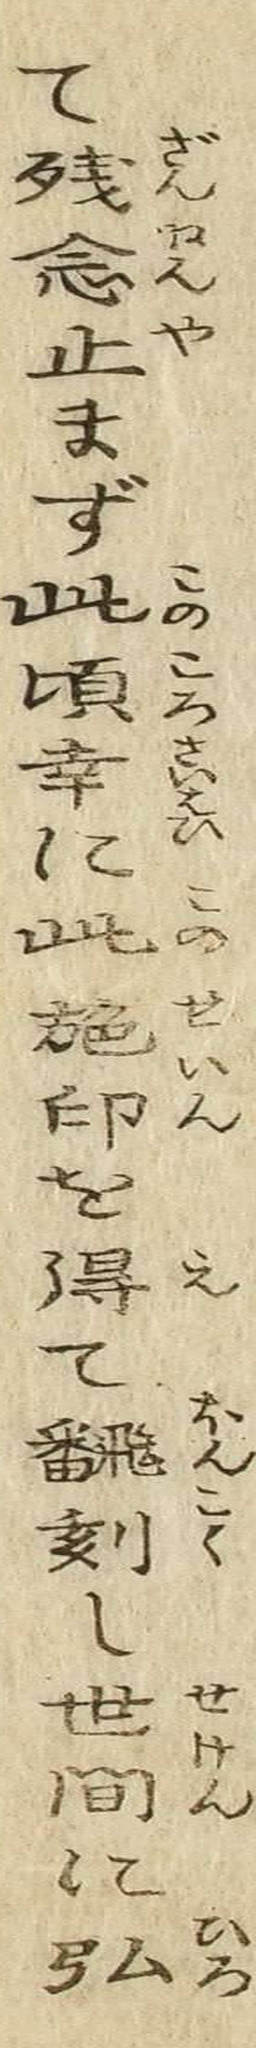て残念止まず此頃幸に此施印を得て飜刻し世間に弘
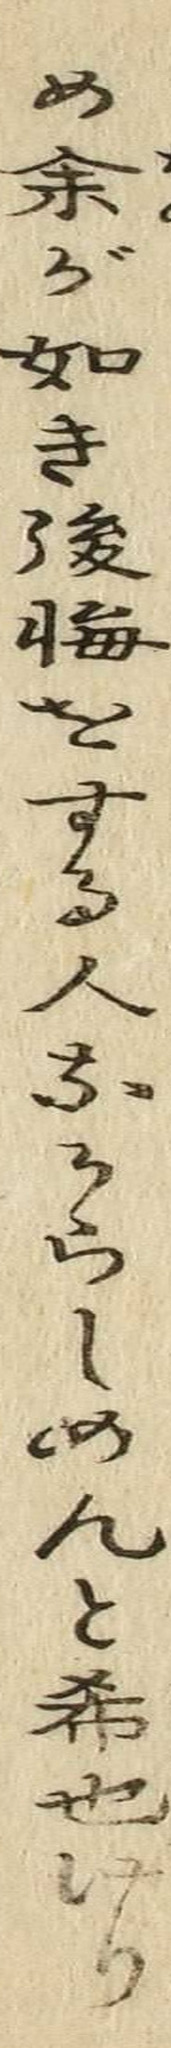め余が如き後悔をする人なからしめんと希也けり
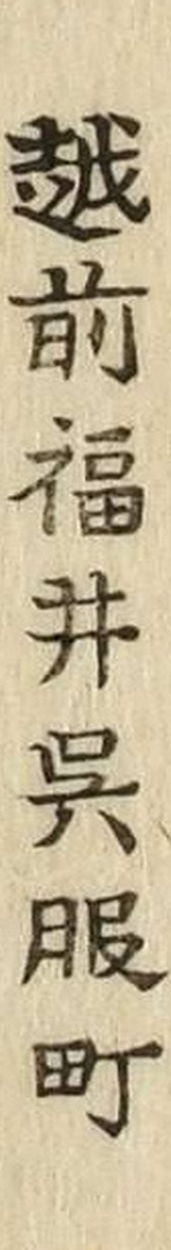越前福井呉服町
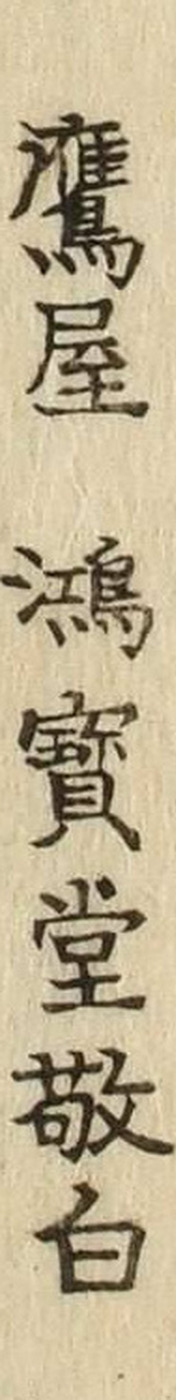鷹屋鴻寳堂敬白
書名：牛痘問答
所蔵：九州大学医学図書館 国文学研究資料館
